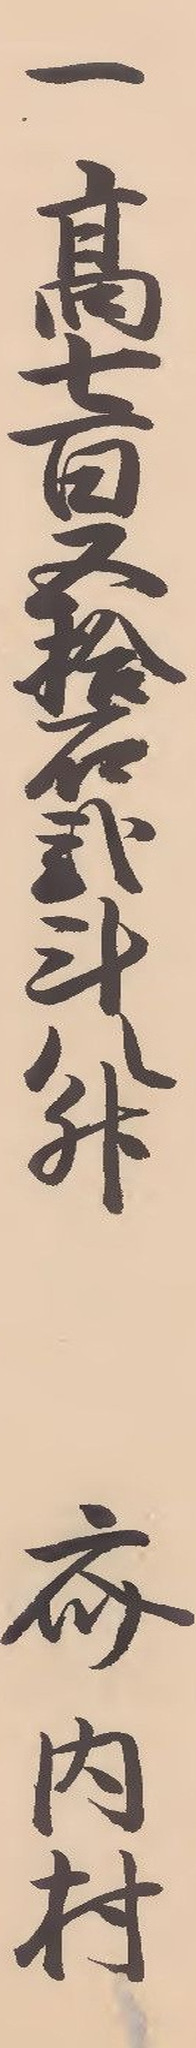一高七百五拾石弐斗八升斉内村
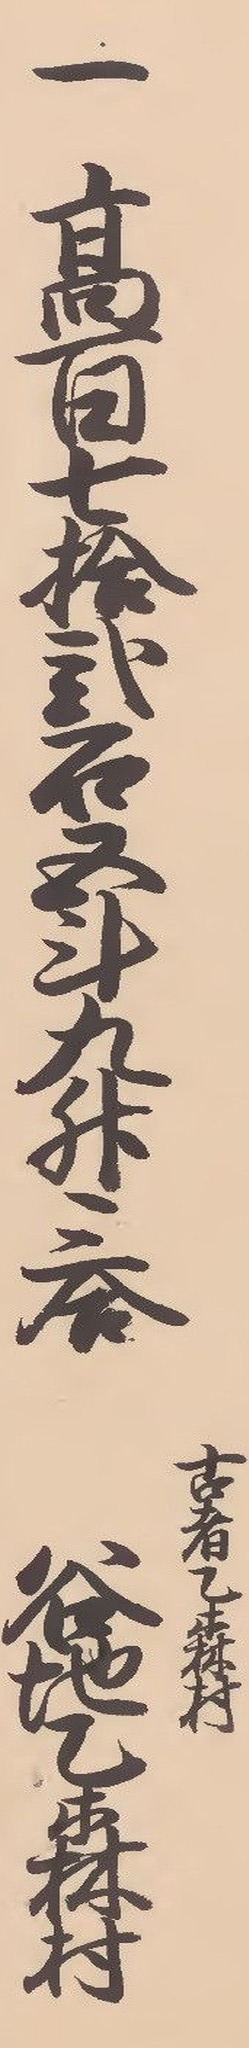一高百七拾弐石五斗九升三合谷地乙森村
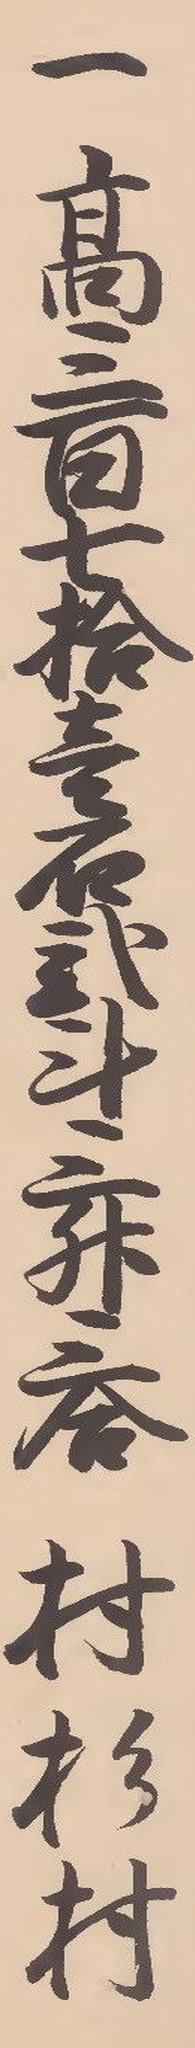一高三百七拾壱石弐斗三升三合村杉村
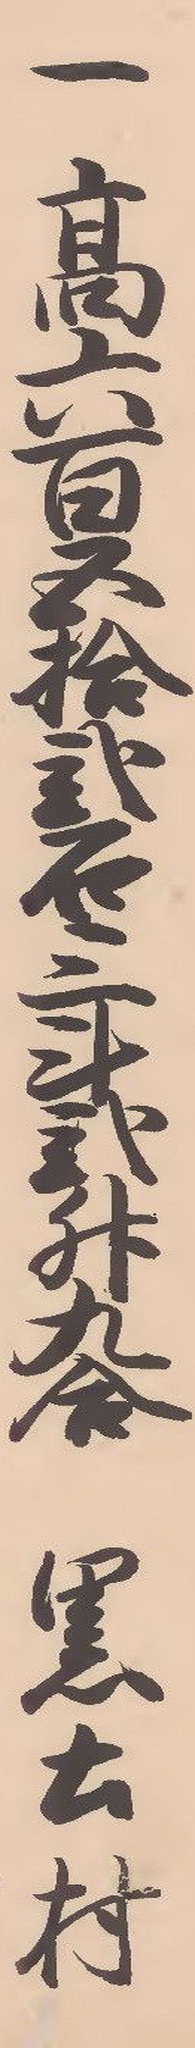一高六百五拾弐石三斗弐升九合黒土村
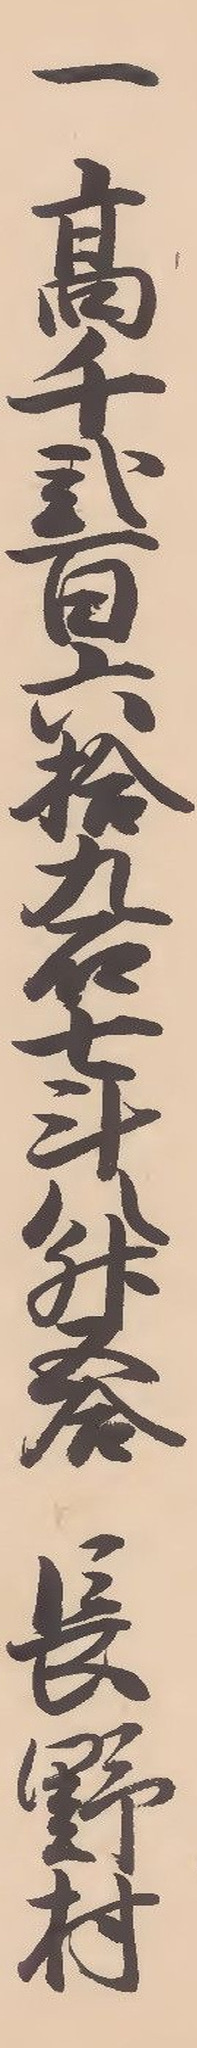一高千弐百六拾九石七斗八升五合長野村
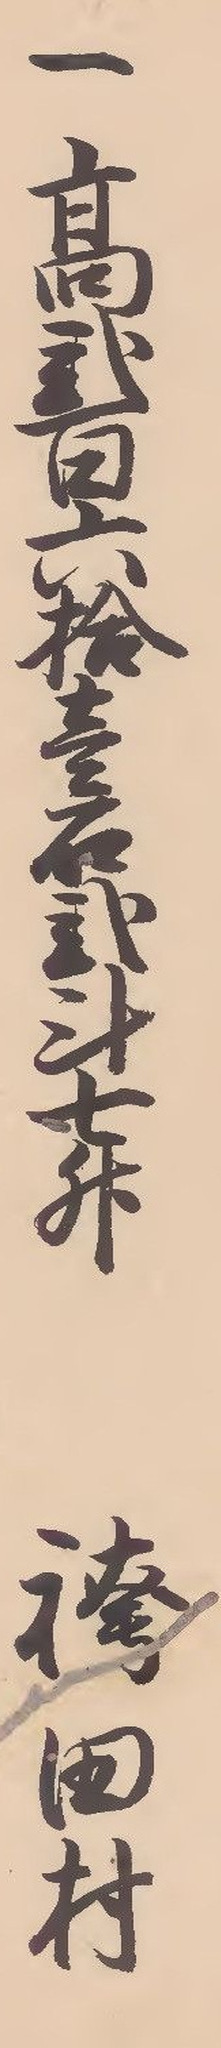一高弐百六拾壱石弐斗七升袴田村

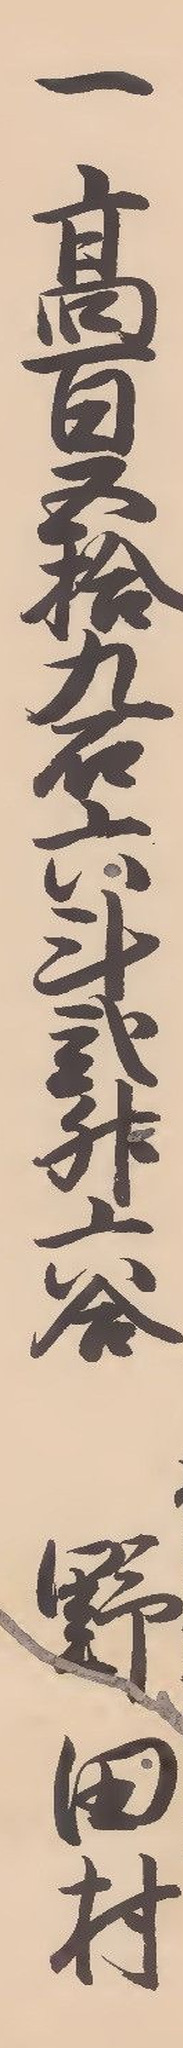一高百五拾九石六斗弐升六合野田村
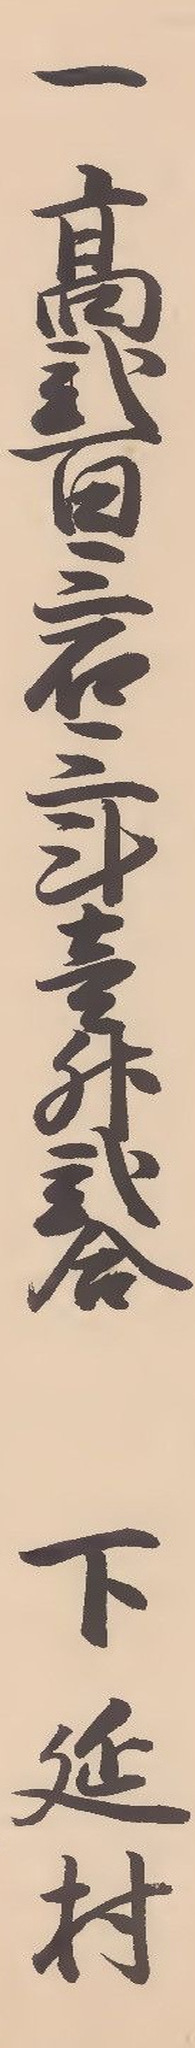一高弐百三石三斗壱升弐合下延村
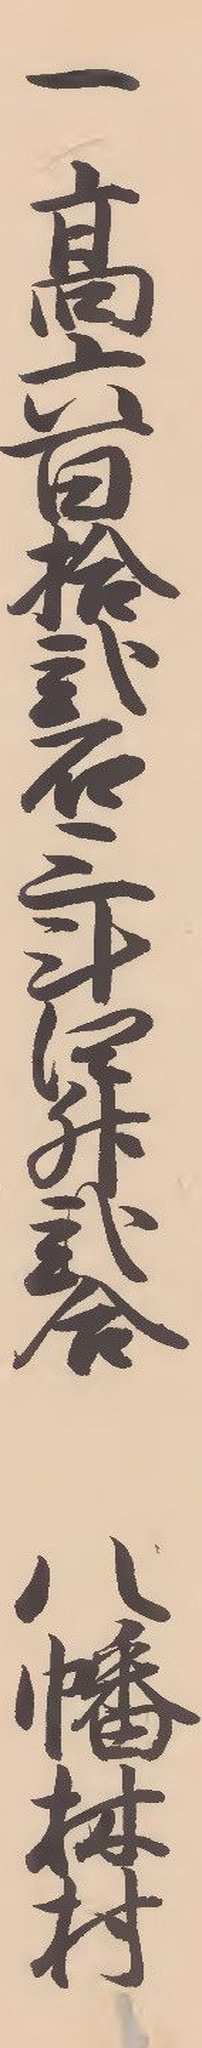一高六百拾弐石三斗四升弐合八幡林村
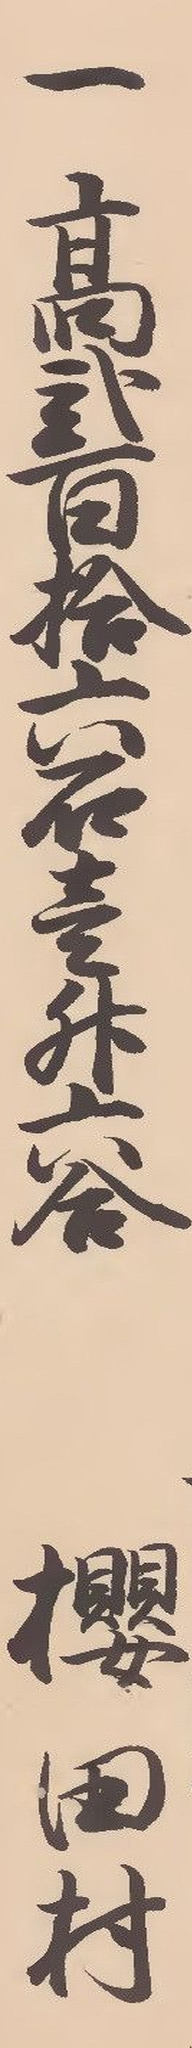一高弐百拾六石壱升六合桜田村
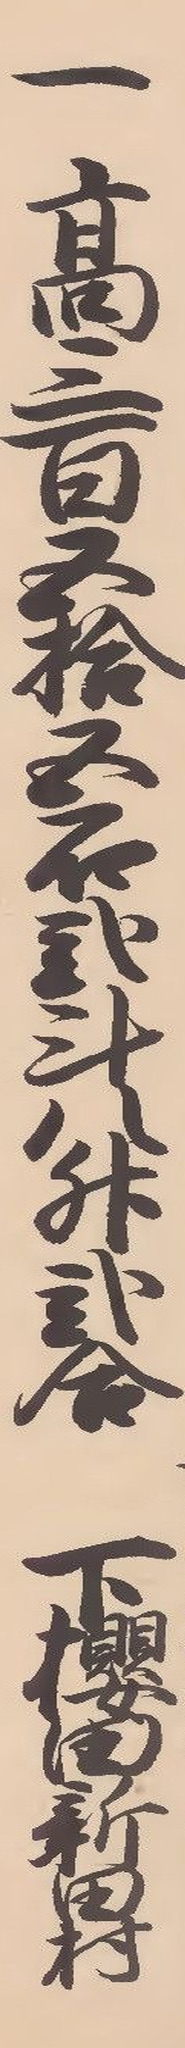一高三百五拾五石弐斗八升弐合下桜田新田村
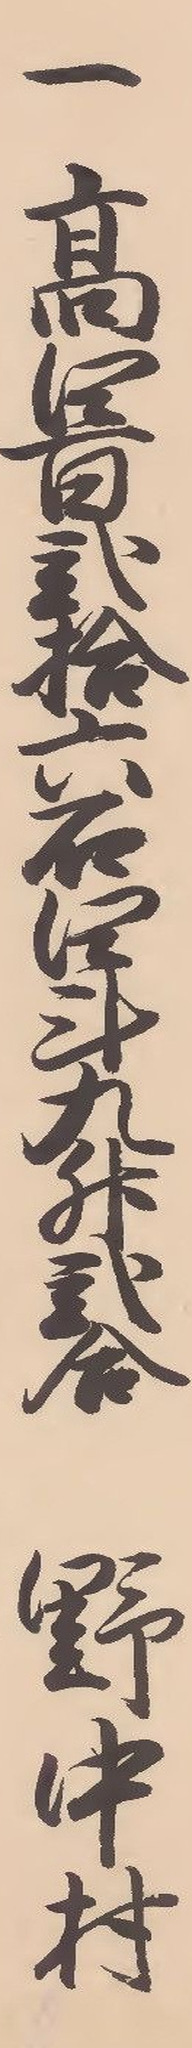一高四百弐拾六石四斗九升弐合野中村
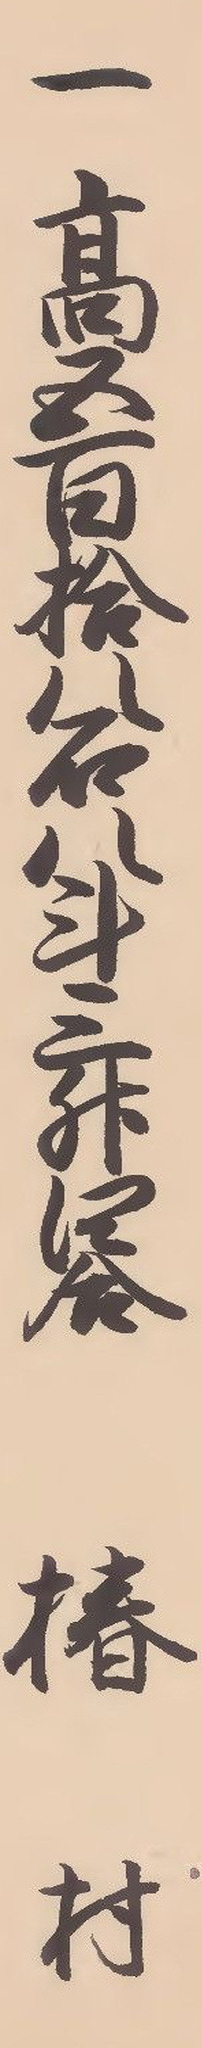一高五百拾八石八斗三升四合椿村
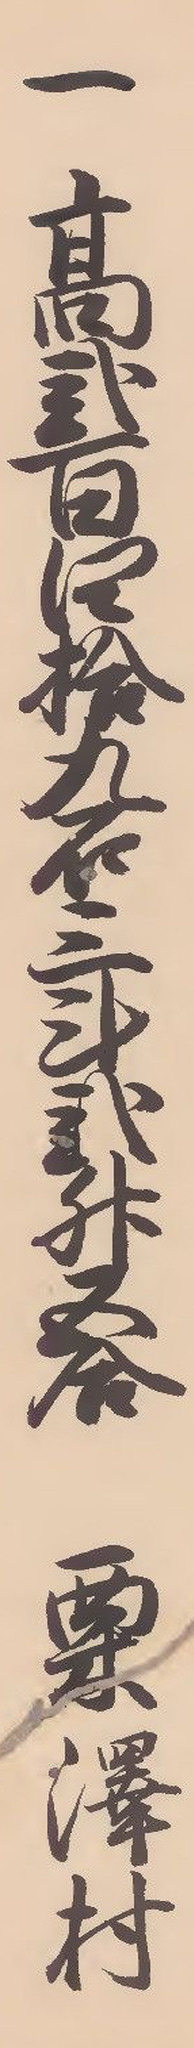一高弐百四拾九石三斗弐升五合栗沢村

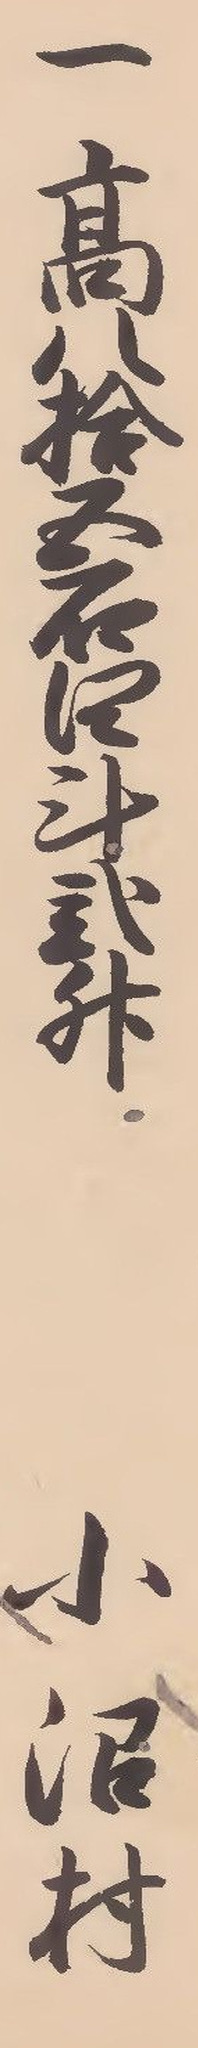一高八拾五石四斗弐升小沼村
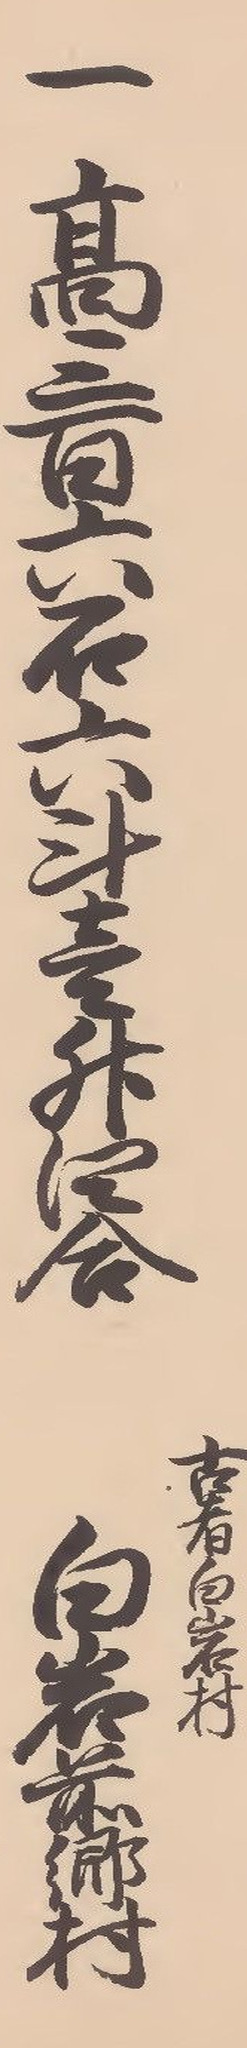一高三百六石六斗壱升四合白岩前郷村
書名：出羽国郷帳　５
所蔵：国立公文書館 National Archives of Japan
